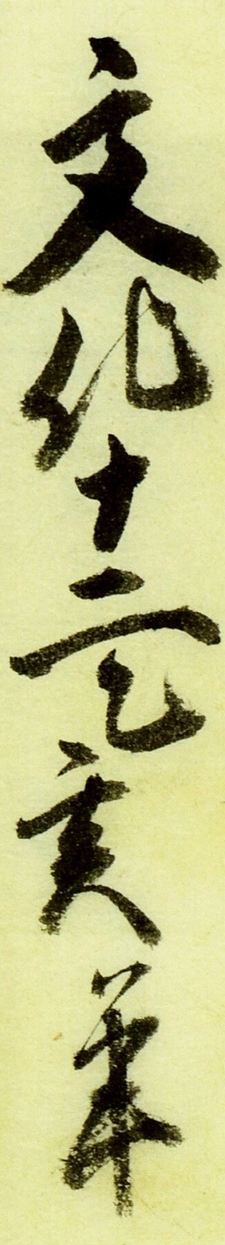文化十二乙亥年
